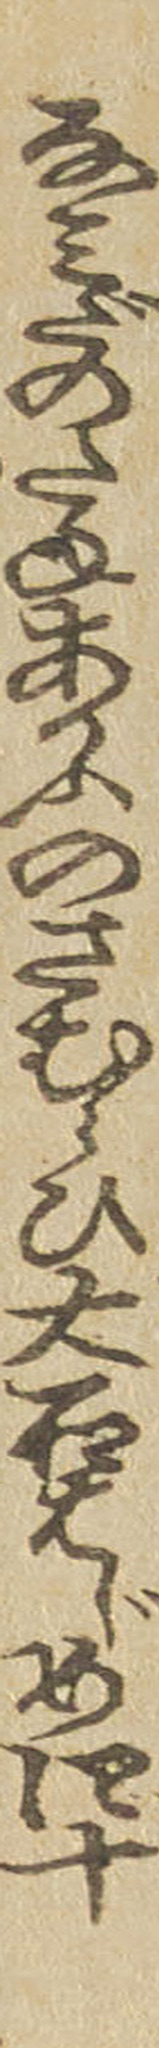なみだのたねあかふのさむらひ大石はじめ四十
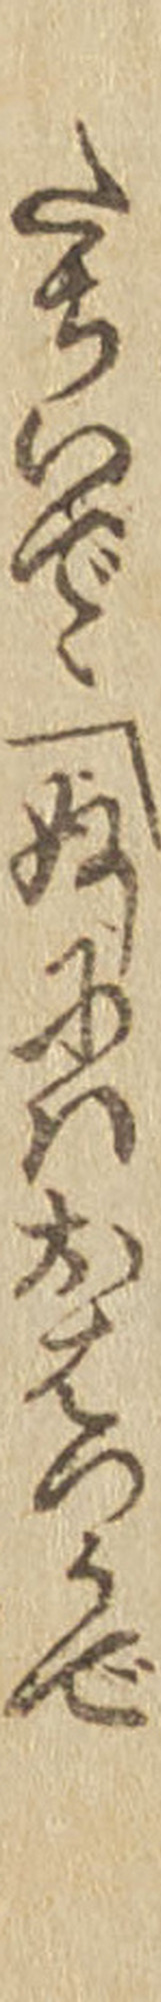たちいでゝ｢ぬしにはおはつらで
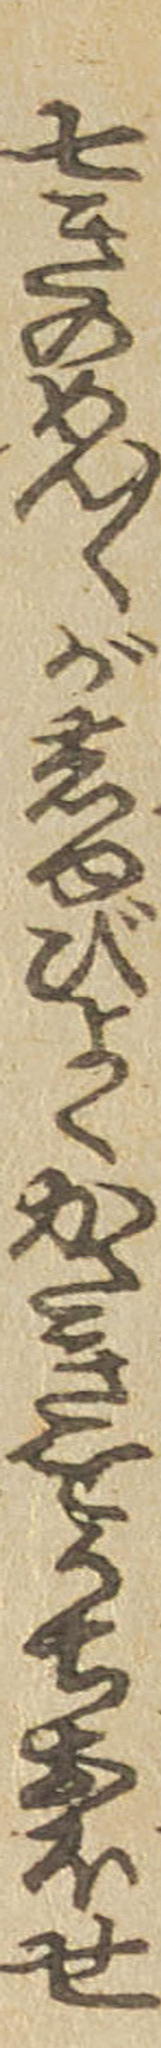七きのめん〳〵がしゆびよくかたきをうちおほせ
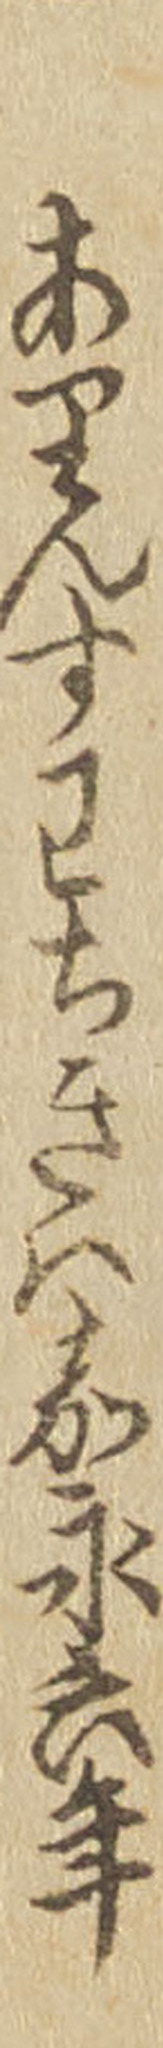ありんすわちきは嘉永六年
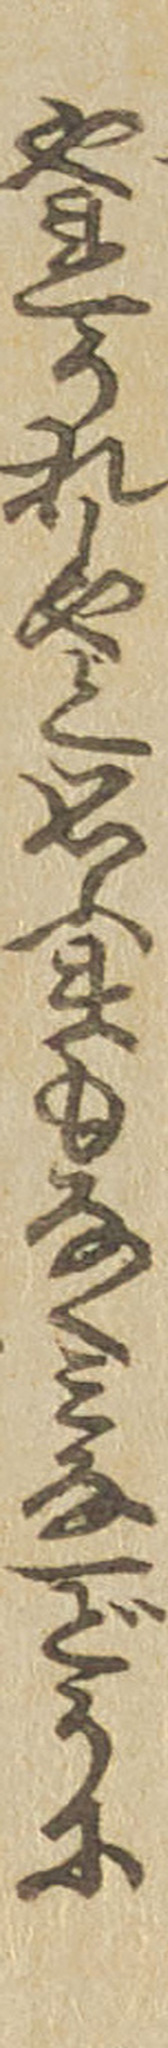やれうれしやと思ふまもなくみな一どうに
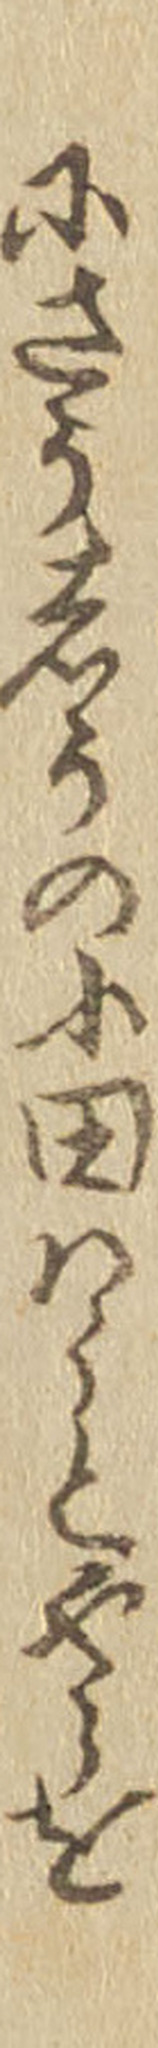にさうしうの小田はらとやらを
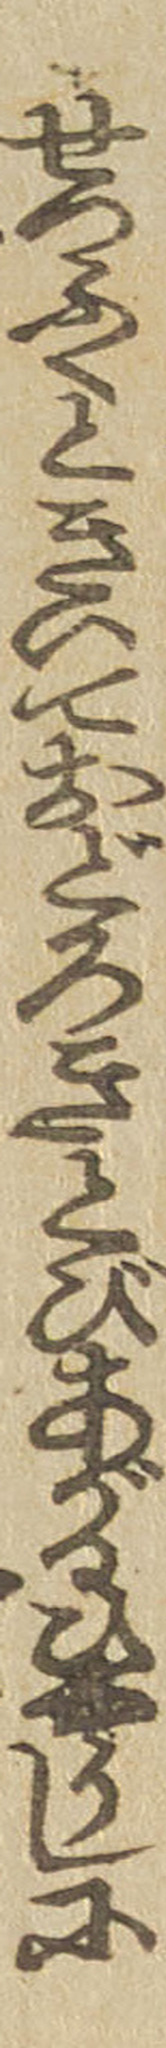せつふくときいておどろきとびあがるひやうしに
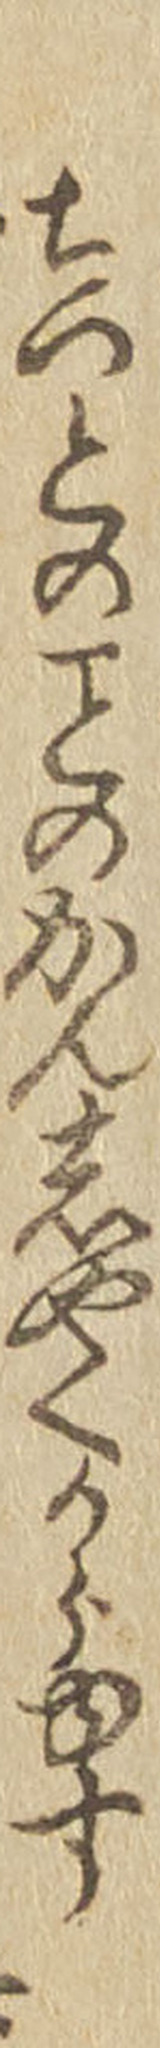ちつとことのかんしやくからゆす
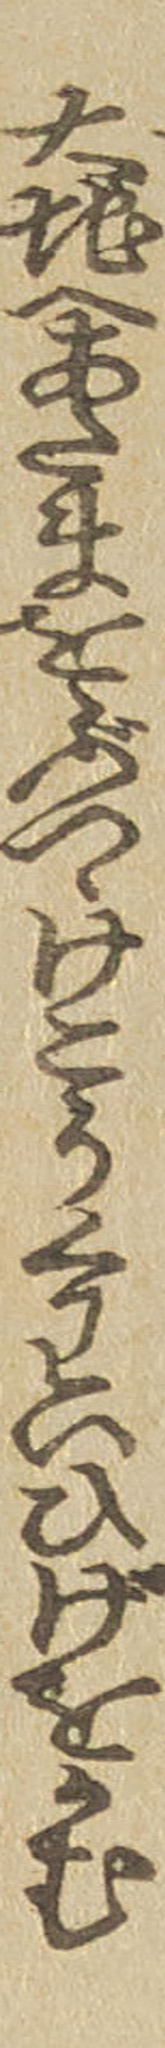大地へあたまをぶつけこうくわいひげをかむ
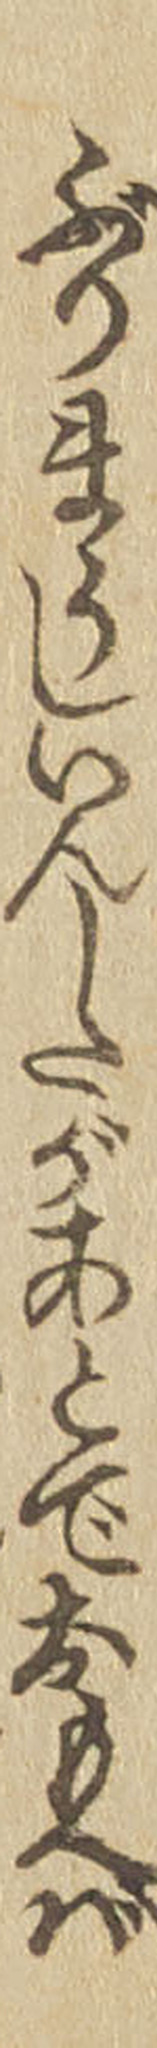ぶりまうしいんしたがあとでおもへば
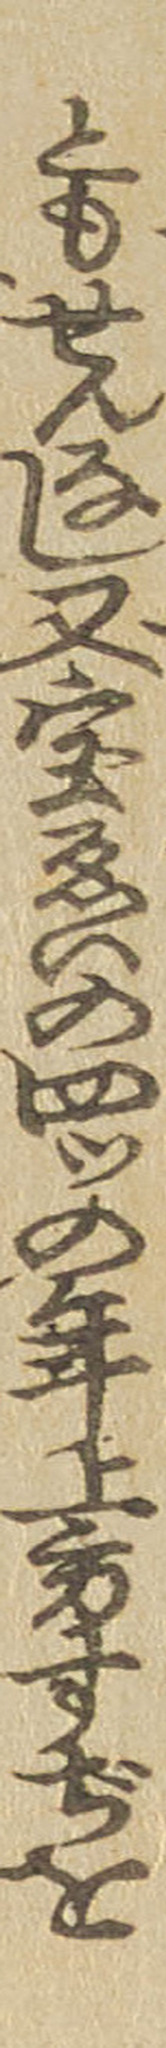ともせんなし又宝ゑいの四っの年上方すぢを
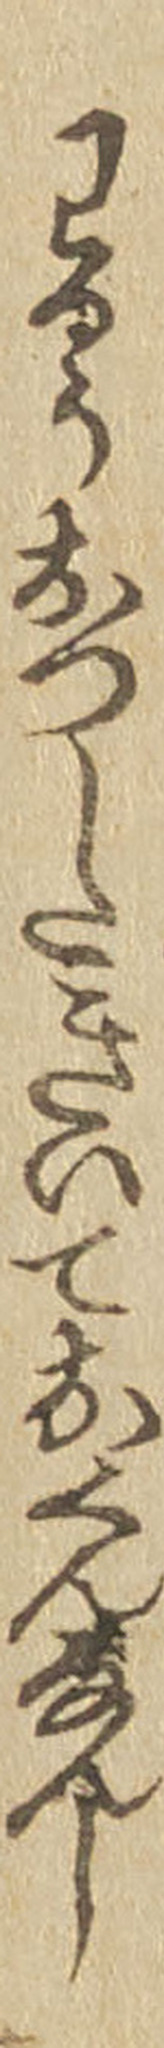わるうおつしたきいておくんなんし
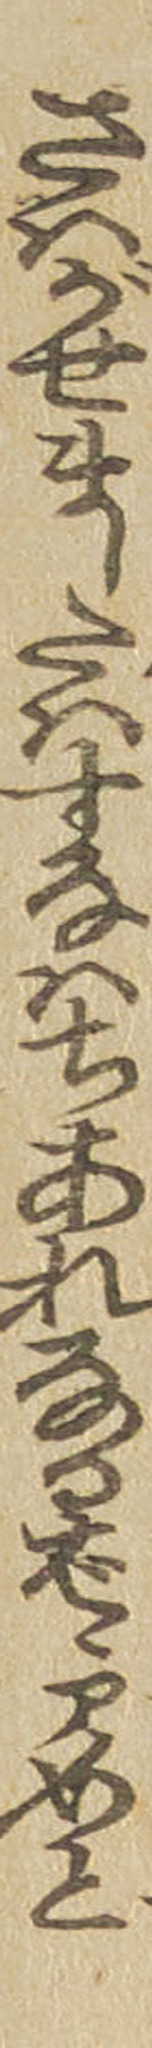さはがせましたはすなはちあれなるばゝァめと
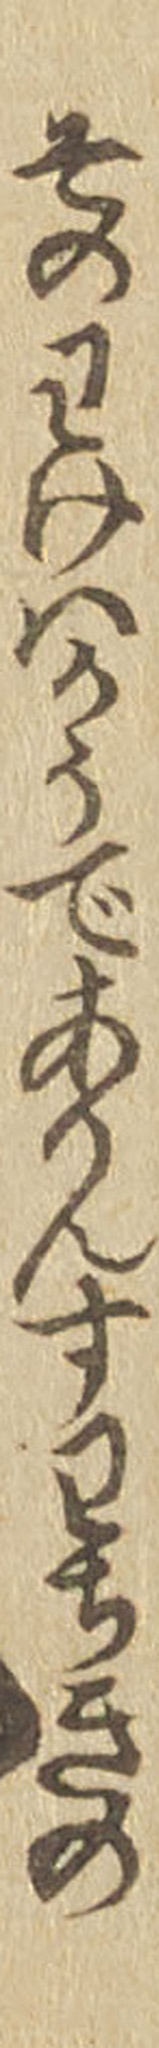そのわけはかうでありんすわちきの
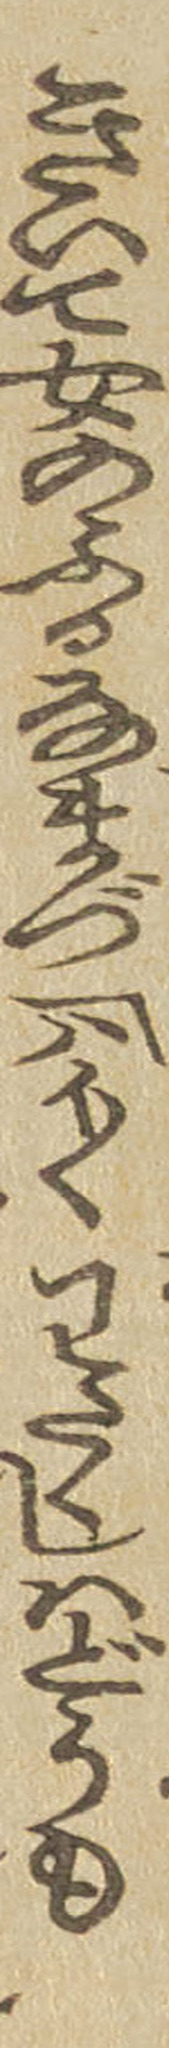きいて女のふるなまづ｢ハイ〳〵わたくしはどうも
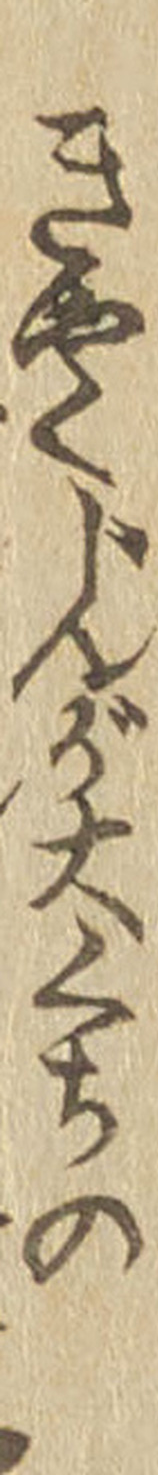きやくじんが大くちの
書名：地震太平記
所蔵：東京大学総合図書館 General Library in the University of Tokyo, JAPAN
